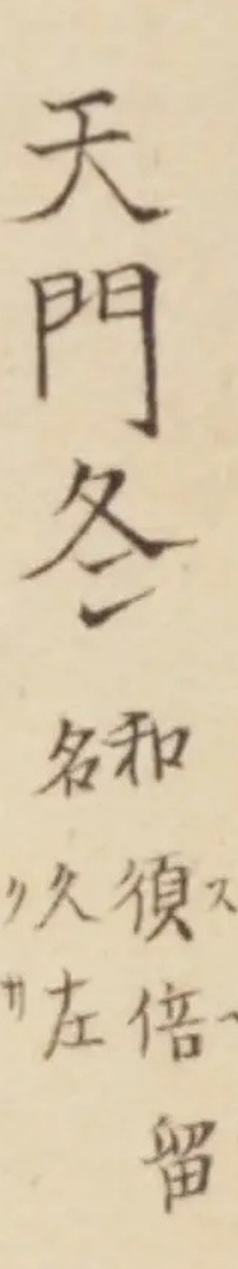天門冬和須倍留
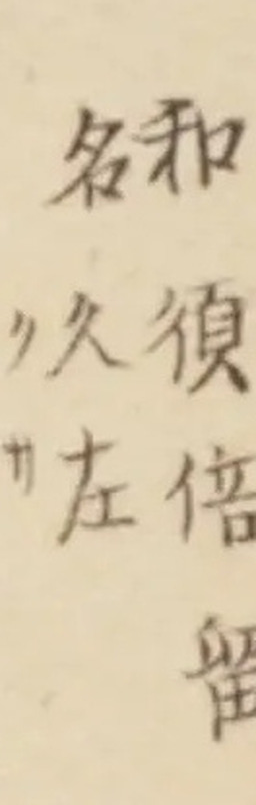名久左
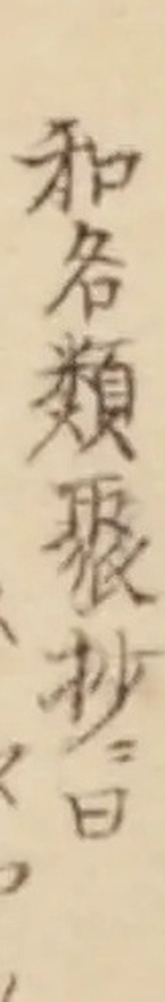和名類聚抄ニ曰
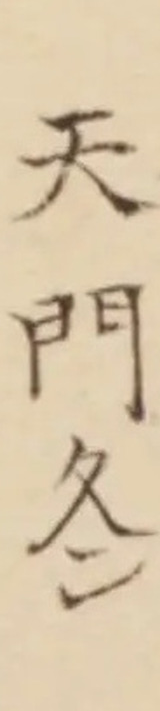天門冬
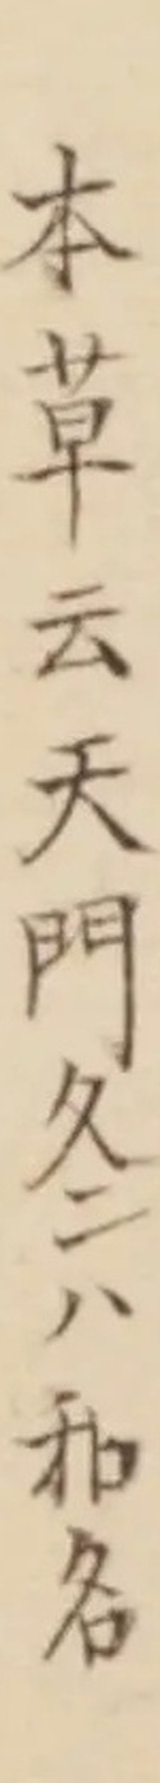本草云天門冬ハ和名
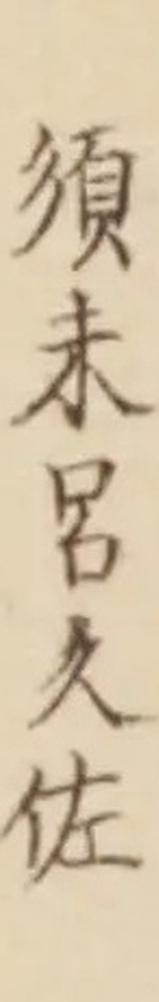須未呂久佐
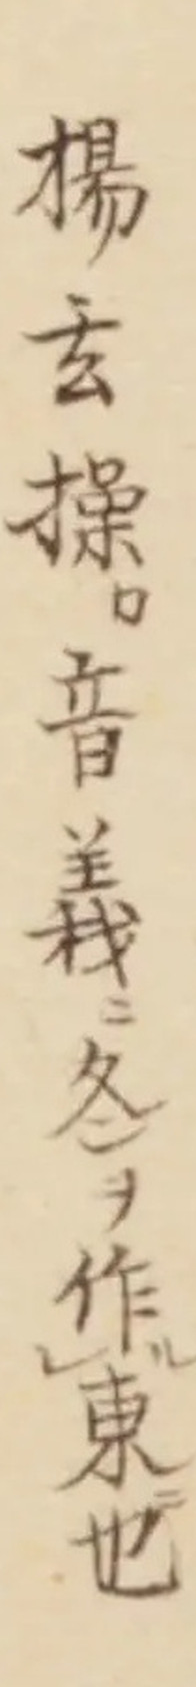楊玄操カ音義ニ冬ヲ作ル東也
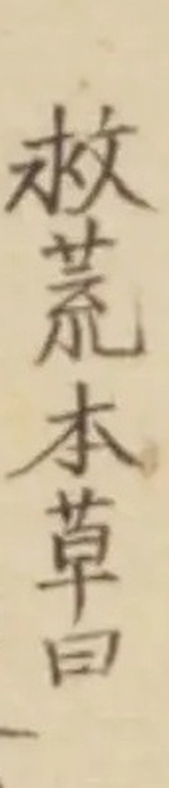救荒本草曰
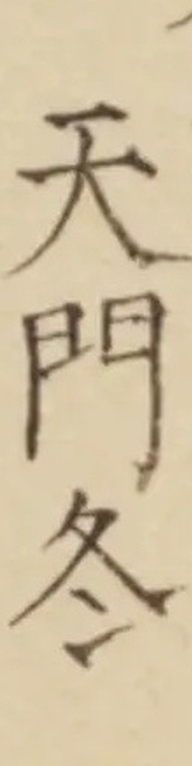天門冬
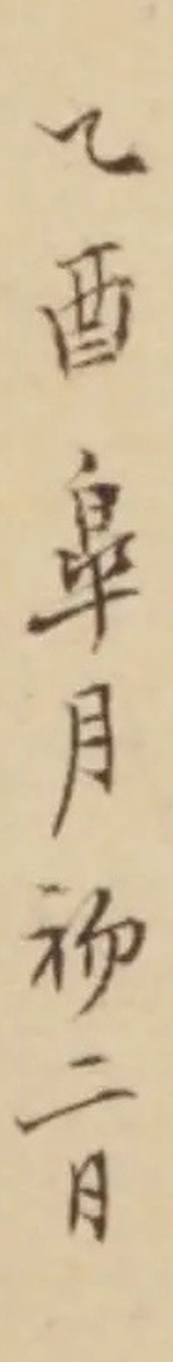乙酉皐月初二日
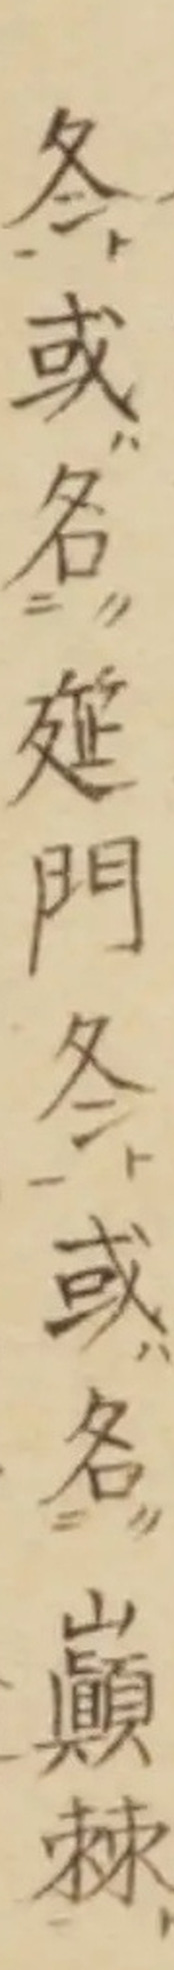冬ト或ハ名ク筳門冬ト或ハ名ク巓棘ト

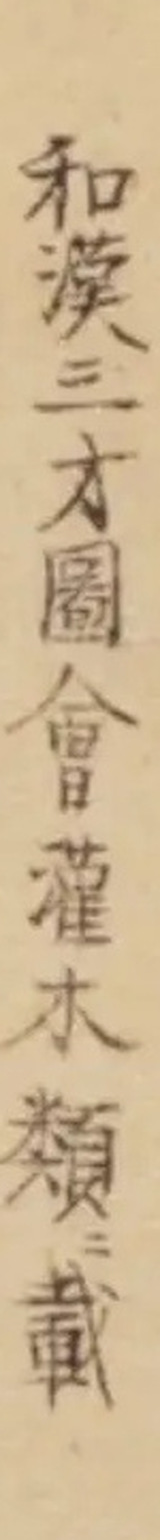和漢三才圖會灌木類ニ曰
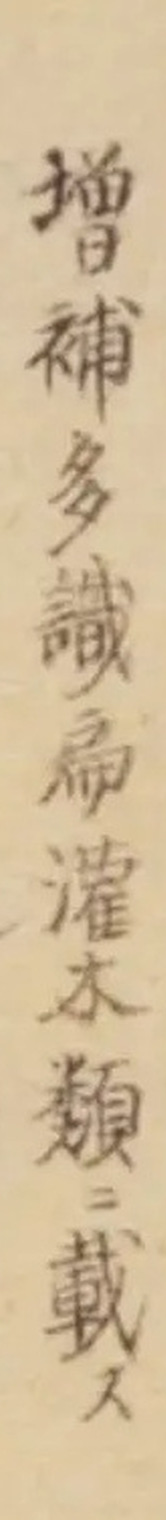増補多識編灌木類ニ載す
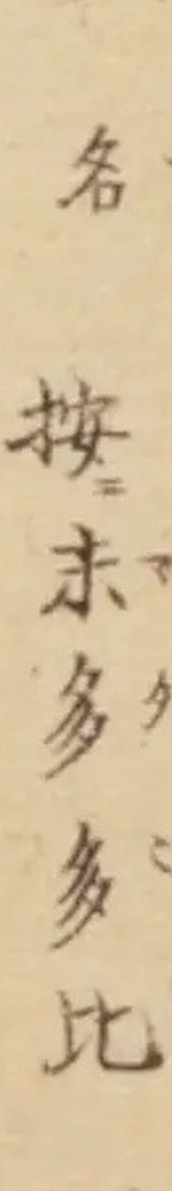名按に未多多比
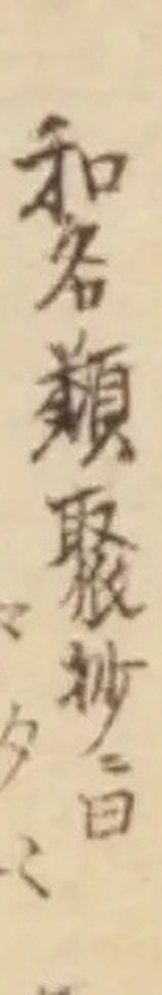和名類聚抄に曰
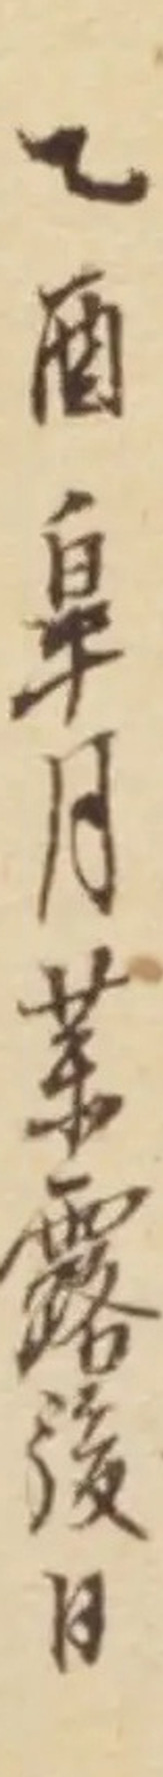乙酉皐月薬露後日
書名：梅園草木花譜夏之部. 3
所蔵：国立国会図書館 National Diet Library, JAPAN
